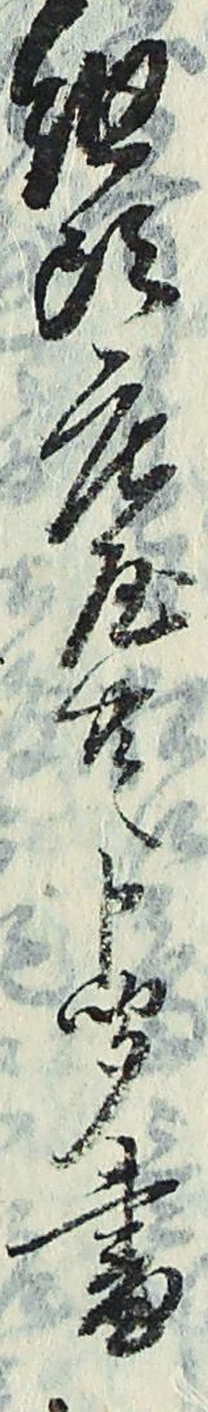○組頭庄屋共へ申聞書
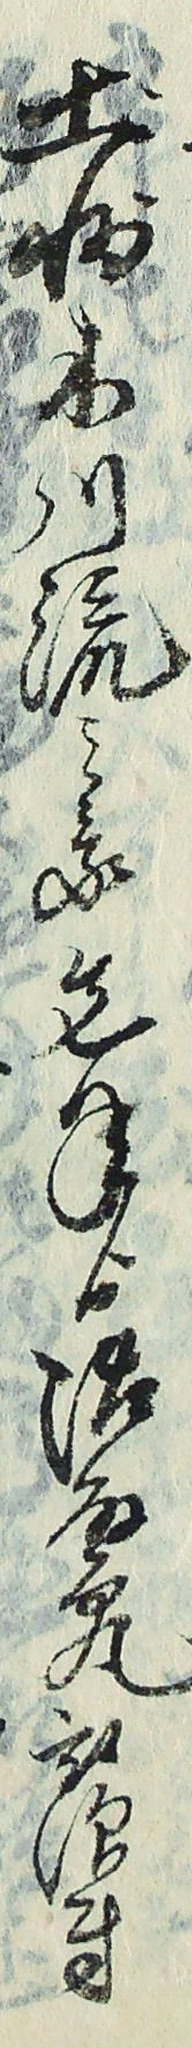土州木川流之義先年ゟ御取究被仰付
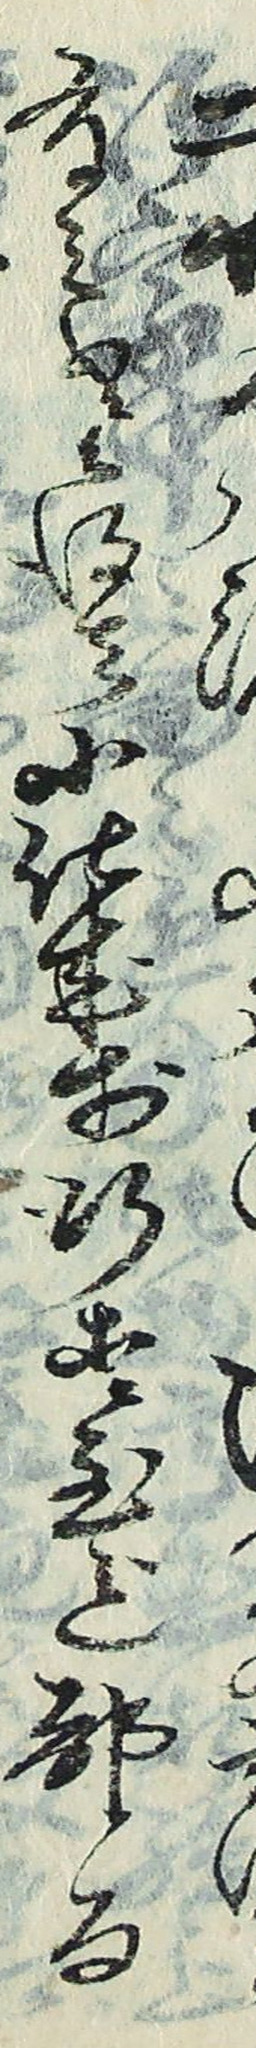有之義ニ候得者小仕成歩行等ニ至迄都而
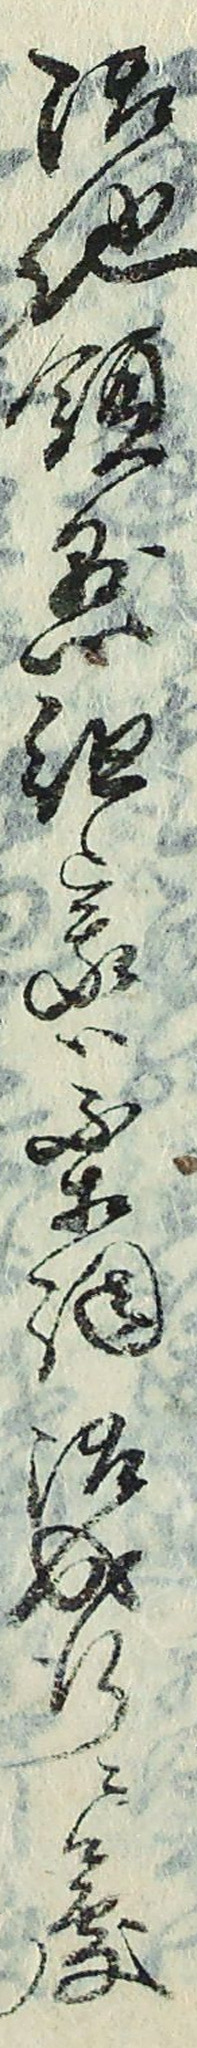御他領懸組候義ハ不相調御成行ニ候處
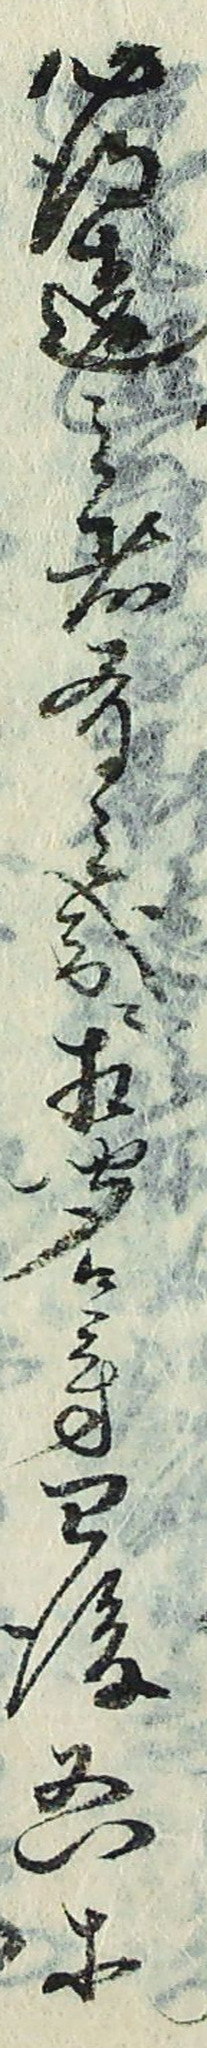心得違之者有之哉ニ相聞候ニ付已後右等
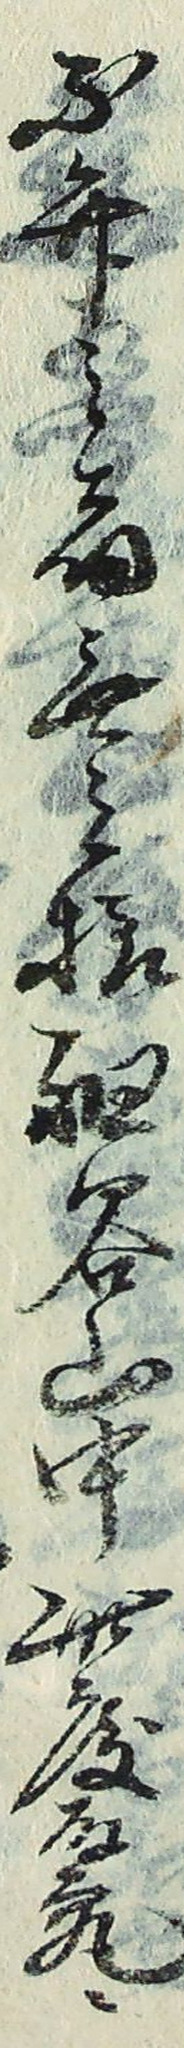不弁之者無之様祖谷山中此度取究ニ
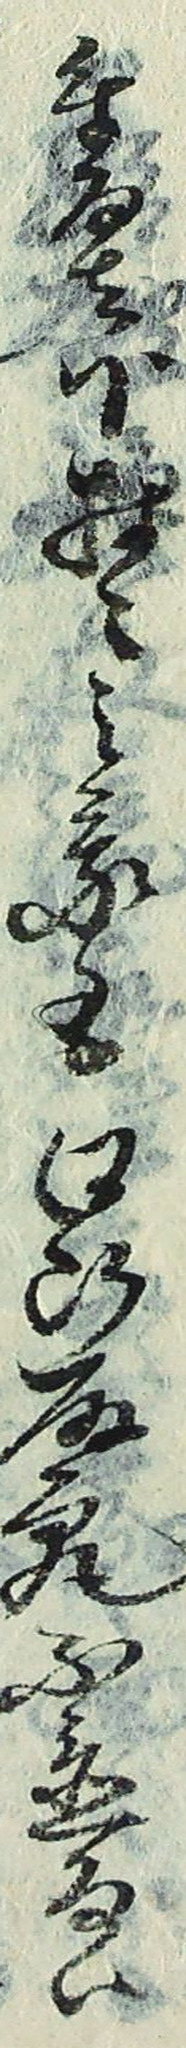付而者外村々之義も同断取究不置而ハ
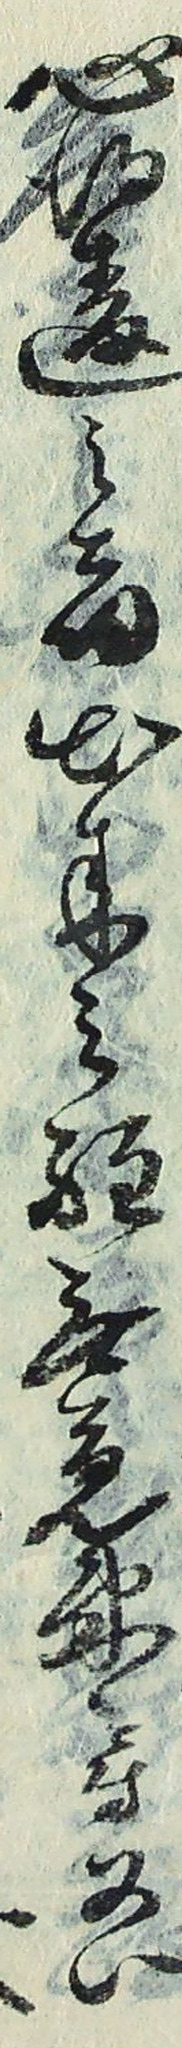心得違之者出来之程無覚束候ニ付右
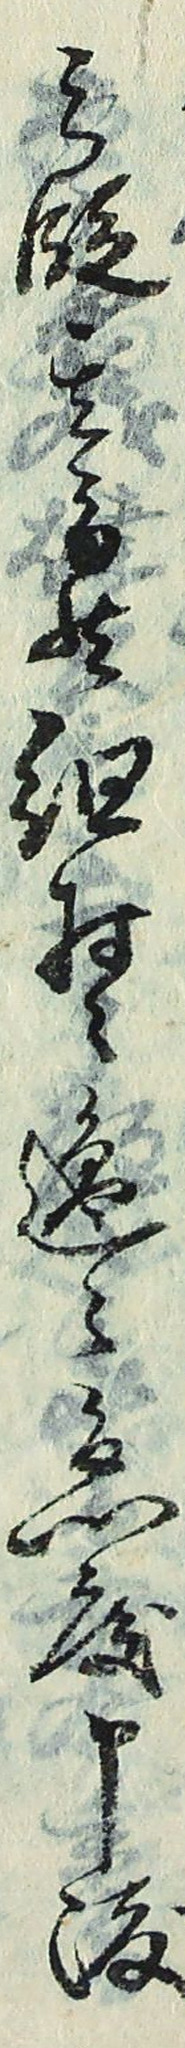之段其方共組村々邊々旨急度申渡
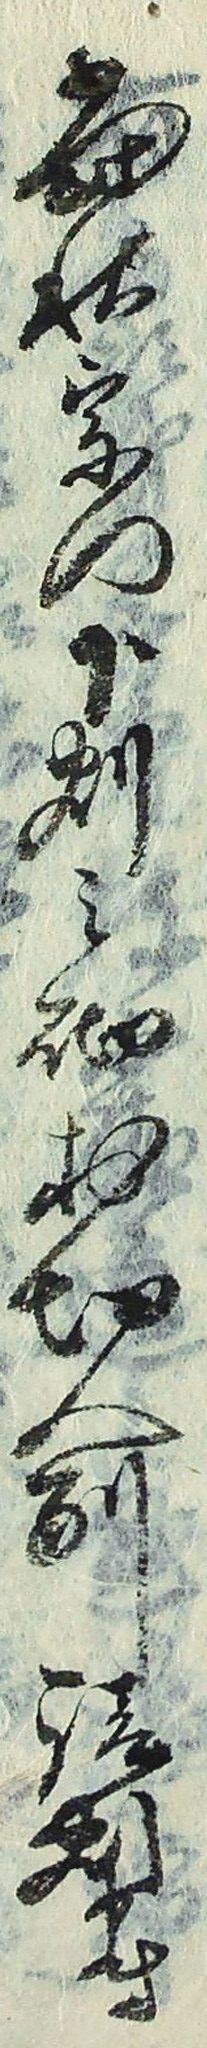當秋宗門下判之砌村切人別請判申付
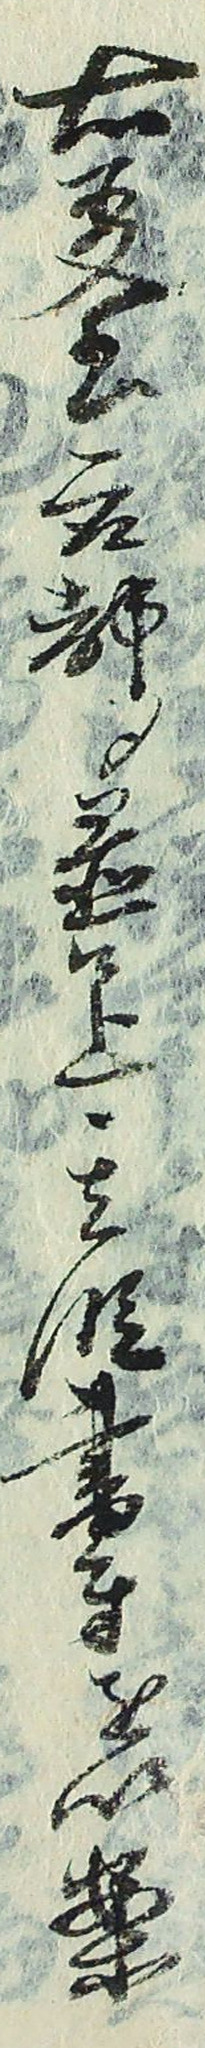右受書取都メ置候上其段書付を以案
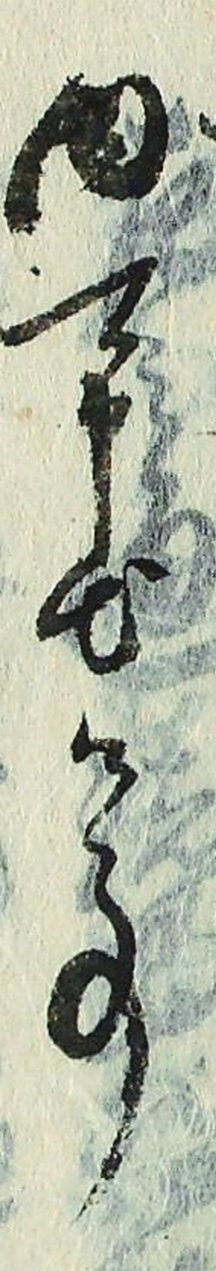内可申出候事
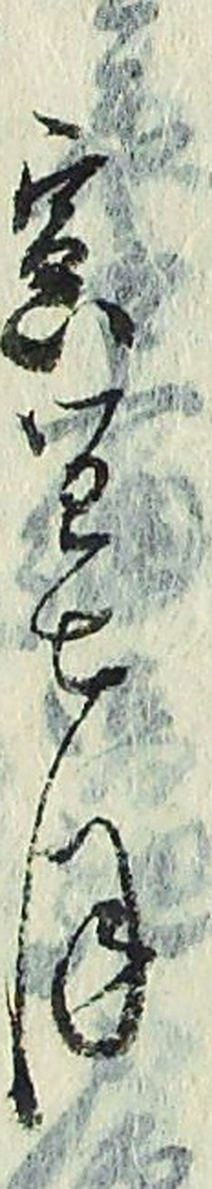寅閏七月
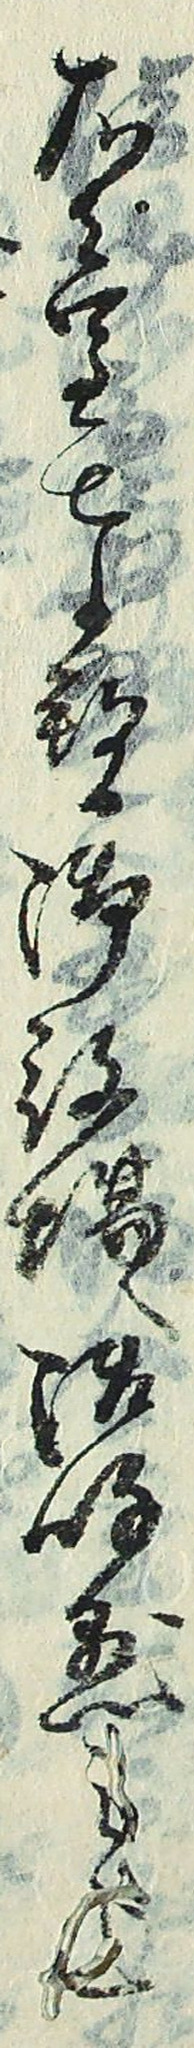右者閏七月朔日御役場へ御呼懸之上
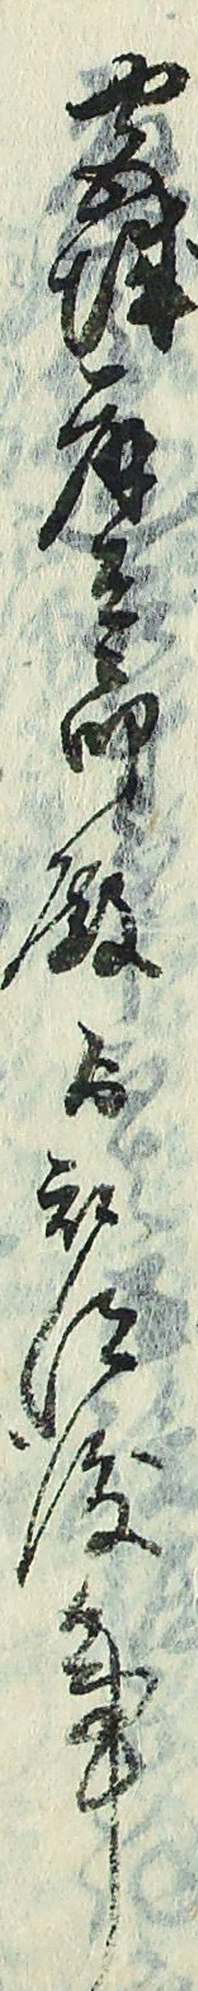宮城麻太郎殿ゟ被仰渡候事

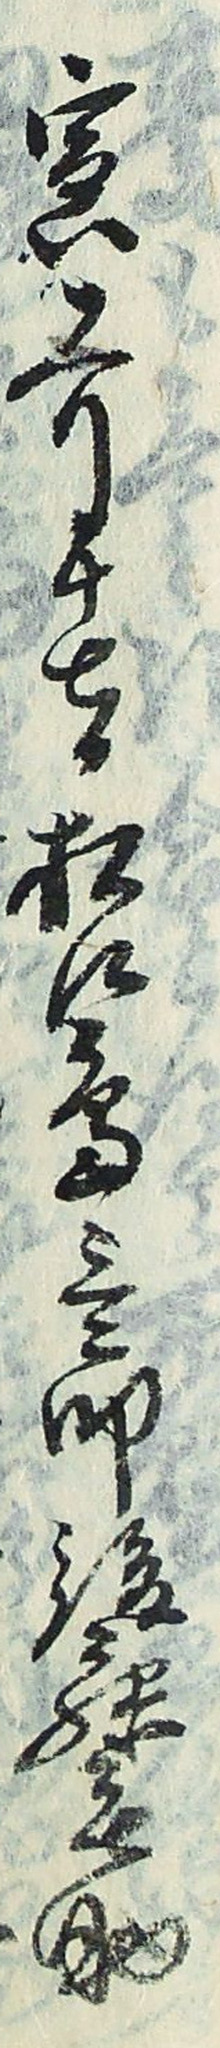○寅十一月十七日松江島三郎後藤庄助
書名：諸御趣意書并御下知向之写
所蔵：鳴門教育大学 Naruto University of Education
